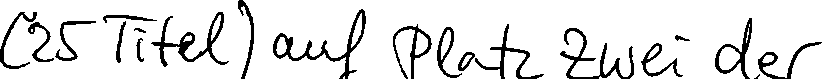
(25 Titel) auf Platz zwei der
